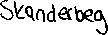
Skanderbeg
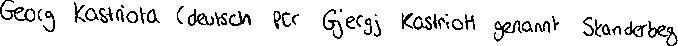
Georg Kastriota (deutsch für Gjergj Kastrioti genannt Skanderbeg
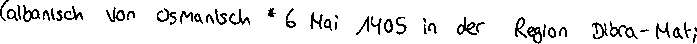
(albanisch von osmanisch * 6. Mai 1405 in der Region Dibra-Mat;
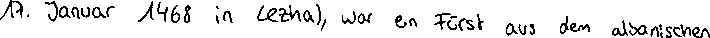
17. Januar 1468 in Lezha), war ein Fürst aus dem albanischen
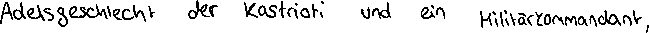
Adelsgeschlecht der Kastrioti und ein Militärkommandant,
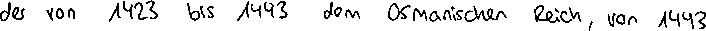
der von 1423 bis 1443 dem Osmanischen Reich, von 1443
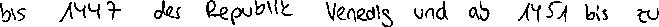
bis 1447 der Republik Venedig und ab 1451 bis zu
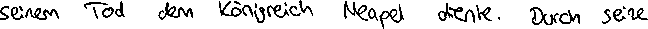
seinem Tod dem Königreich Neapel diente. Durch seine
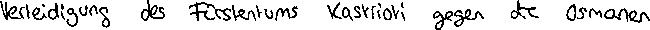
Verteidigung des Fürstentums Kastrioti gegen die Osmanen
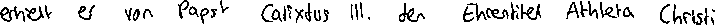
erhielt er von Papst Calixtus III. den Ehrentitel Athleta Christi
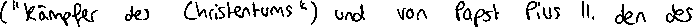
("Kämpfer des Christentums") und von Papst Pius II. den des
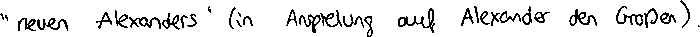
"neuen Alexanders" (in Anspielung auf Alexander den Großen).
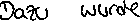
Dazu wurde
